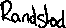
Randstad
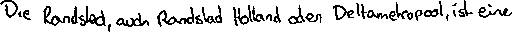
Die Randstad, auch Randstad Holland oder Deltametropool, ist eine
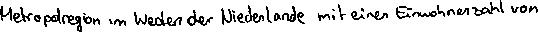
Metropolregion im Westen der Niederlande mit einer Einwohnerzahl von
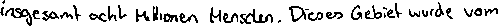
insgesamt acht Millionen Menschen. Dieses Gebiet wurde vom
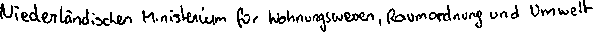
Niederländischen Ministerium für Wohnungswesen, Raumordnung und Umwelt
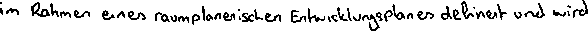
im Rahmen eines raumplanerischen Entwicklungsplanes definiert und wird
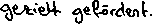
gezielt gefördert.
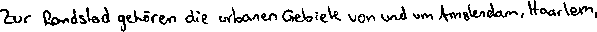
Zur Randstad gehören die urbanen Gebiete von und um Amsterdam, Haarlem,
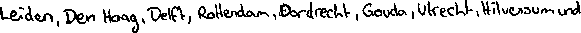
Leiden, Den Haag, Delft, Rotterdam, Dordrecht, Gouda, Utrecht, Hilversum und
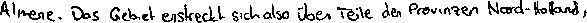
Almere. Das Gebiet erstreckt sich also über Teile der Provinzen Noord-Holland,
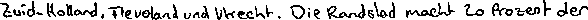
Zuid-Holland, Flevoland und Utrecht. Die Randstad macht 20 Prozent der
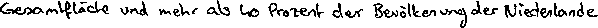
Gesamtfläche und mehr als 40 Prozent der Bevölkerung der Niederlande
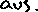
aus.
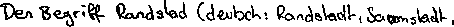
Der Begriff Randstad (deutsch: Randstadt, Saumstadt,
